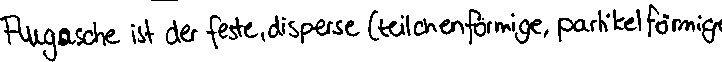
Flugasche ist der feste, disperse (teilchenförmige, partikelförmige,
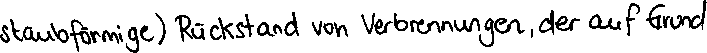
staubförmige) Rückstand von Verbrennungen, der auf Grund
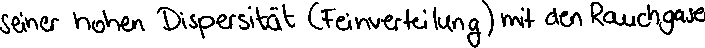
seiner hohen Dispersität (Feinverteilung) mit den Rauchgasen
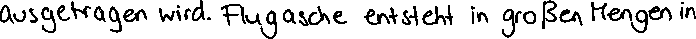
ausgetragen wird. Flugasche entsteht in großen Mengen in
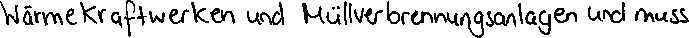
Wärmekraftwerken und Müllverbrennungsanlagen und muss
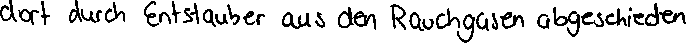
dort durch Entstauber aus den Rauchgasen abgeschieden
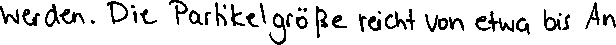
werden. Die Partikelgröße reicht von etwa bis An
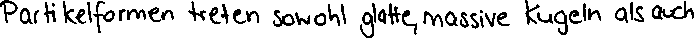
Partikelformen treten sowohl glatte, massive Kugeln als auch
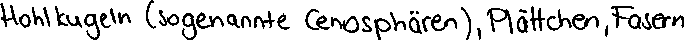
Hohlkugeln (sogenannte Cenosphären), Plättchen, Fasern
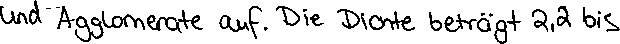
und Agglomerate auf. Die Dichte beträgt 2,2 bis
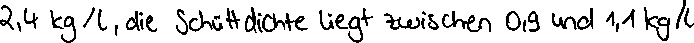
2,4 kg/l, die Schüttdichte liegt zwischen 0,9 und 1,1 kg/l.
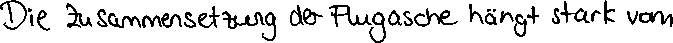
Die Zusammensetzung der Flugasche hängt stark vom
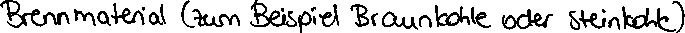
Brennmaterial (zum Beispiel Braunkohle oder Steinkohle)
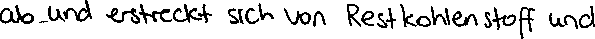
ab und erstreckt sich von Restkohlenstoff und
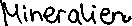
Mineralien
